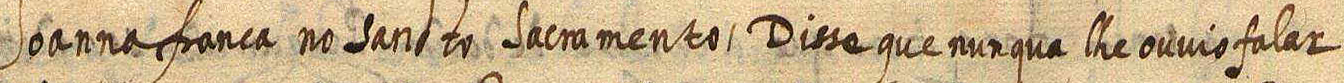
Joanna franca no sancto Sacramento / Disse que nunqua lhe ouuio falar
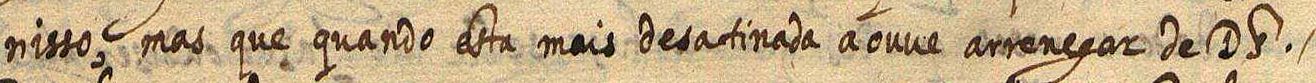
nisso, mas que quando esta mais desatinada a ouue arrenegar de Ds̄. /
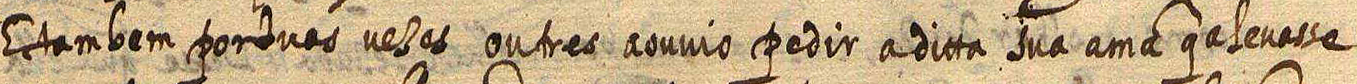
E tambem por duas uezes ou tres a ouuio pedir a ditta sua ama q̄ a leuasse
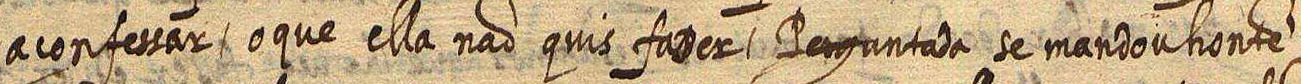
a confessar / o que ella naõ quis fazer / Perguntada se mandou hontē
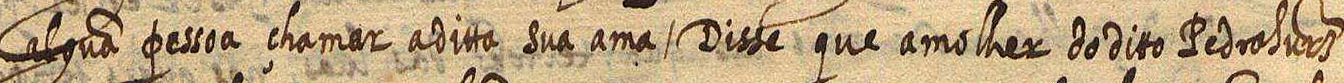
alguā pessoa çhamar a ditta sua ama / Disse que a molher do ditto Pedralur̄z
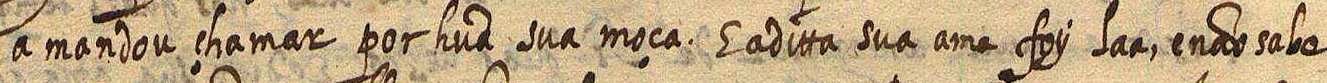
a mandou çhamar por huā sua moça. E a ditta sua ama foy laa, e não sabe
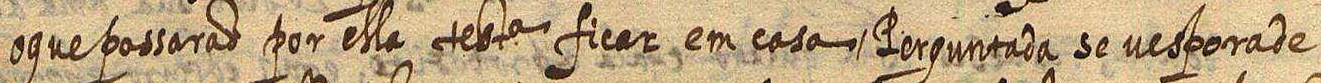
o que passaraõ por ella testa ficar em casa / Perguntada se uespora de
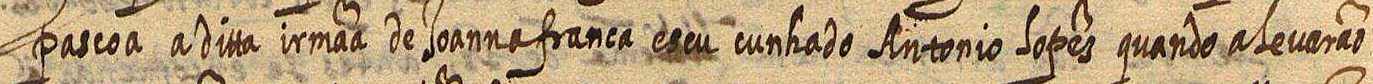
pascoa a ditta irmāa de Joanna franca e seu cunhado Antonio Lopēz quando a leuarão
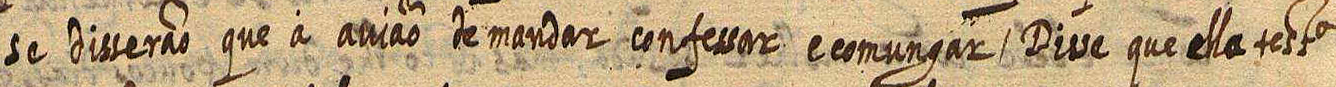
se disserão que a auião de mandar confessar e comungar / Disse que ella testa
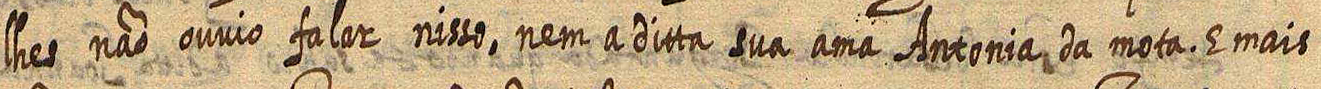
lhes não ouuio falar nisso, nem a ditta sua ama Antonia da mota. E mais
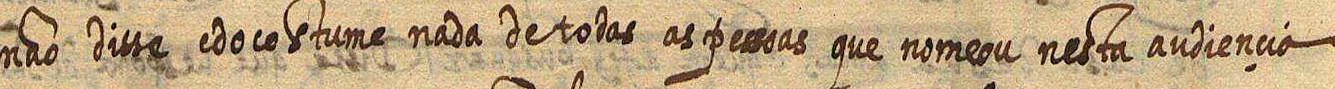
não disse e do costume nada de todas as pessoas que nomeou nesta audiençia
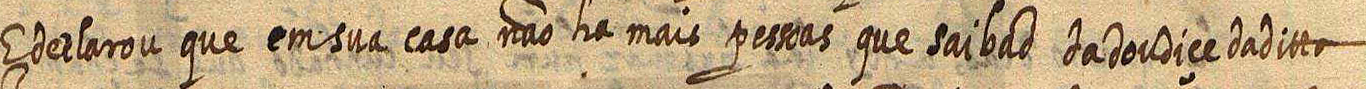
E declarou que em sua casa não ha mais pessoas que saibão da doudiçe da ditta
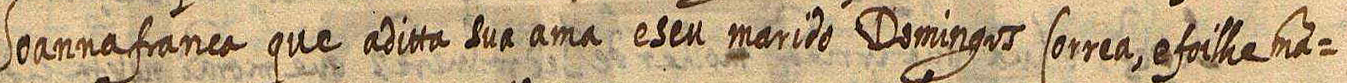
Joanna franca que a ditta sua ama e seu marido Domingos Correa, e foilhe mā
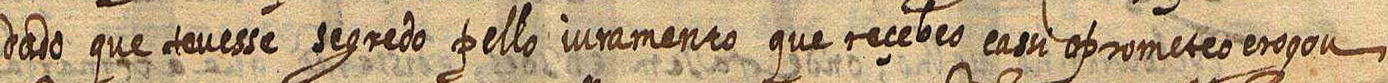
dado que teuesse segredo pello iuramento que reçebeo e assi o prometeo e rogou
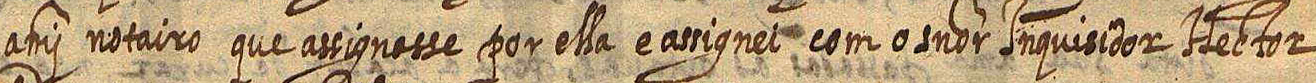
a mj̄ notairo que assignasse por ella e assignei com o snōr Inquisidor Hector
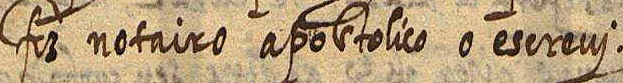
fr̄z notairo apostolico o escreuj.
